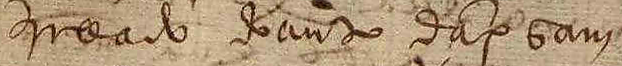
trellado do auto da p̄sam
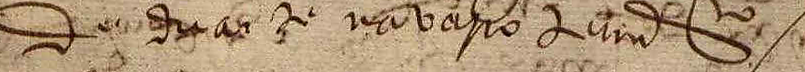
de duarte navarro temdro /
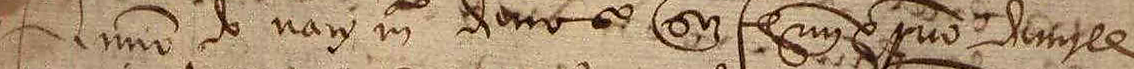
Anno do nacymto de noso s̄or Jhūu xp̄uo de mjll
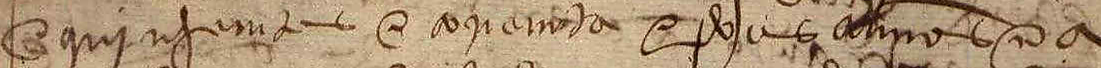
e qujnhemtos e coremta e dous annos ē a
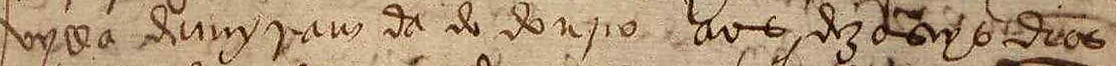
vylla de myramda do douro aos dezaseys dias
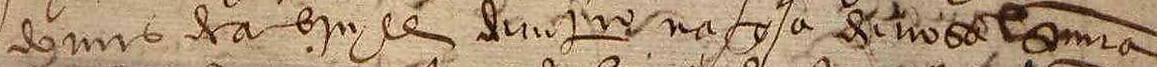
do mes de abryll demtro na JḡJa de nosa s̄nnra
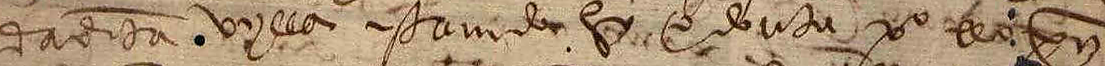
da dita vyla estamdo hy o doutor po llopez
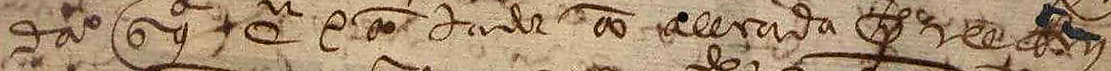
daoseqa Cor e c̄otador c̄o allçada p̄o ell Rey
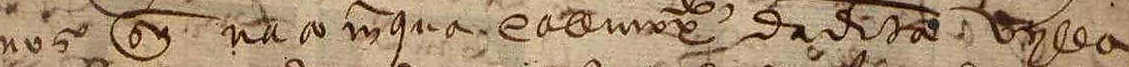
noso s̄or na com̄qua e allmoxdo da dita vylla
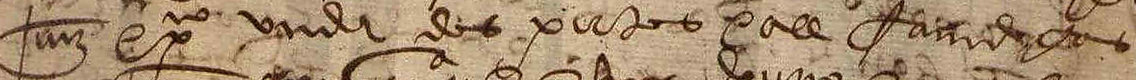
Juiz e provedor dos portos e allfamdegas
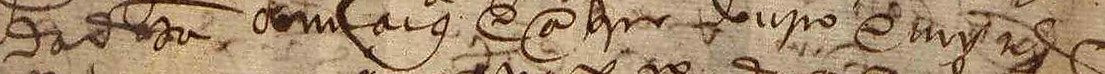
da dita comarqa e ātre douro e mynho
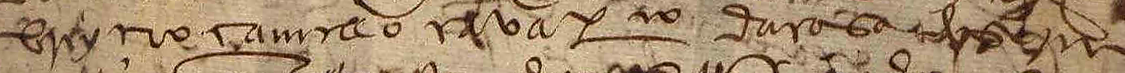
bryçio camello cavaLro da casa do sere
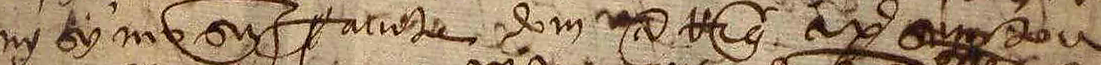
nysymo s̄or Jfamte dom āRiq̄e ap̄semtou
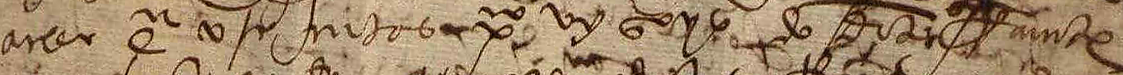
a elle Cor oJe çertas provysoys do dito Jfamte
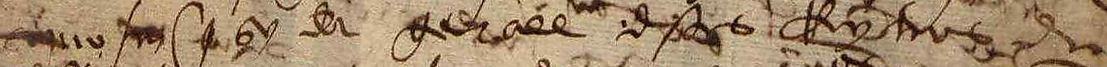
como Jmq̄sydor gerall destes Reynos de
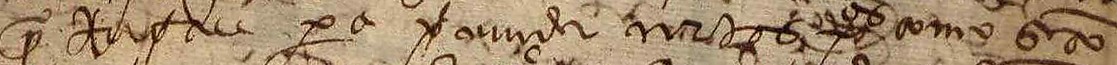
p̄otugall ꝑa p̄emder certas pas como se cō
